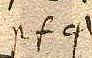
p f 41
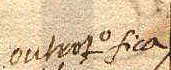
outro to fica
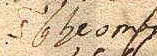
s̄ q̄ he o mes
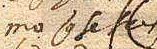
mo q̄ se tres
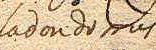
ladou do mes
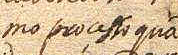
mo proçesso quā
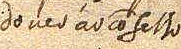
do ueo ao cōselho
